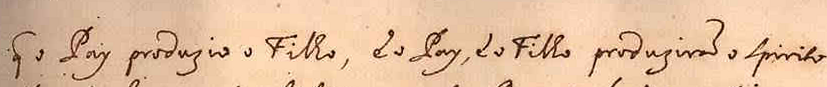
q̄ o Pay produzio o filho, e o Pay, e o Filho produziraõ o Spirito
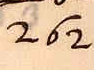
262
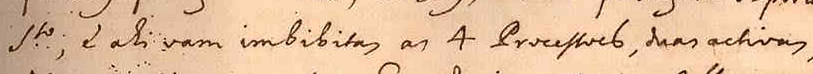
S.to, e ahi vam imbibitas as 4 Processoes, duas activas,
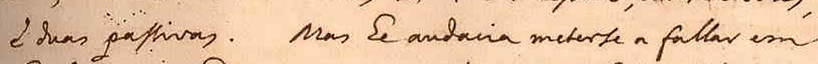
e duas passivas. Mas he audacia meterse a fallar em
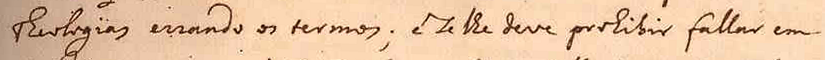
theologias errando os termos; e se lhe deve prohibir fallar em
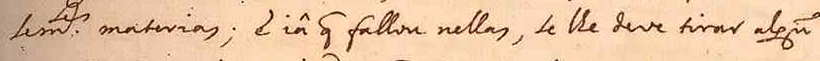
sem.tes materias; e iâ q̄ fallou nellas, se lhe deve tirar algū
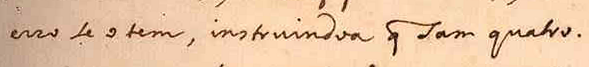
erro se o tem, instruindoa q̄ sam quatro.
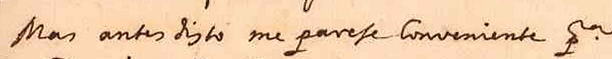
Mas antes disto me parese Conveniente p.ra
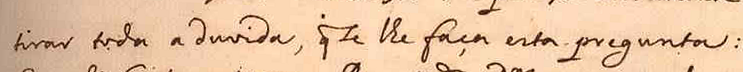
tirar toda a duvida, q̄ se lhe faça esta pregunta:
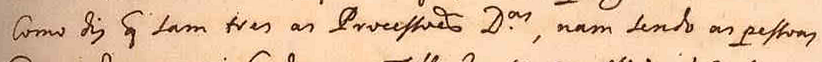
Como dis q̄ sam tres as Processoẽs D.as, nam sendo as pessoas
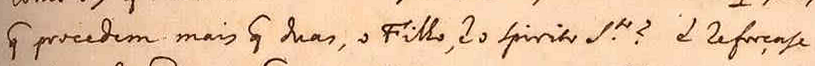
q̄ procedem mais q̄ duas, o Filho, e o Spirito S.to? e Reforçase
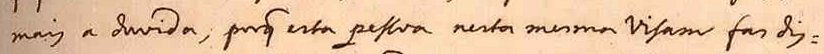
mais a duvida, porq̄ esta pessoa nesta mesma visam fas dis
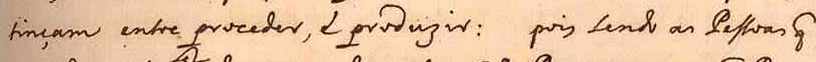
tinçam entre proceder, e produzir: pois sendo as Pessoas q̄
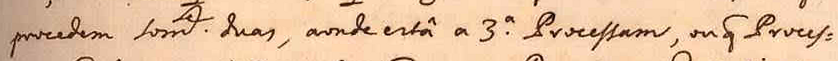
procedem som.te duas, aonde estâ a 3.a Processam, ou q̄ Proces
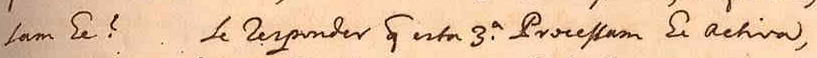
sam he? Se Responder q̄ esta 3.a Processam he activa,
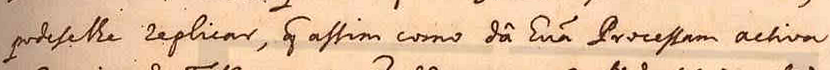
podese lhe replicar, q̄ assim como dâ huā Processam activa
